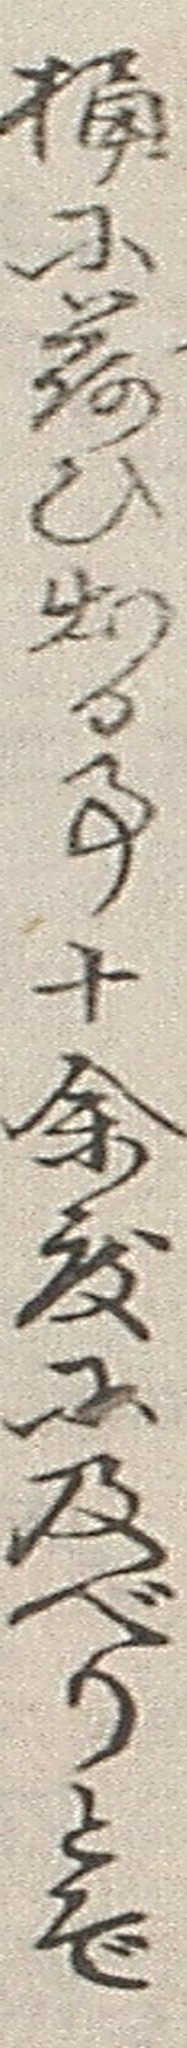桶に荷ひ出る事十余度に及べりとぞ
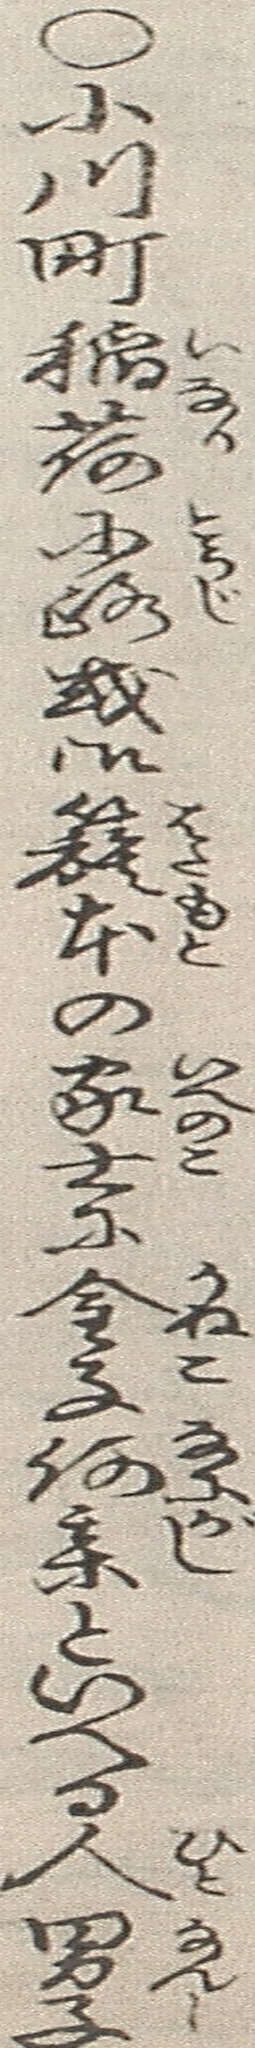◯小川町稲荷小路或御籏本の家士に金子某といへる人男子
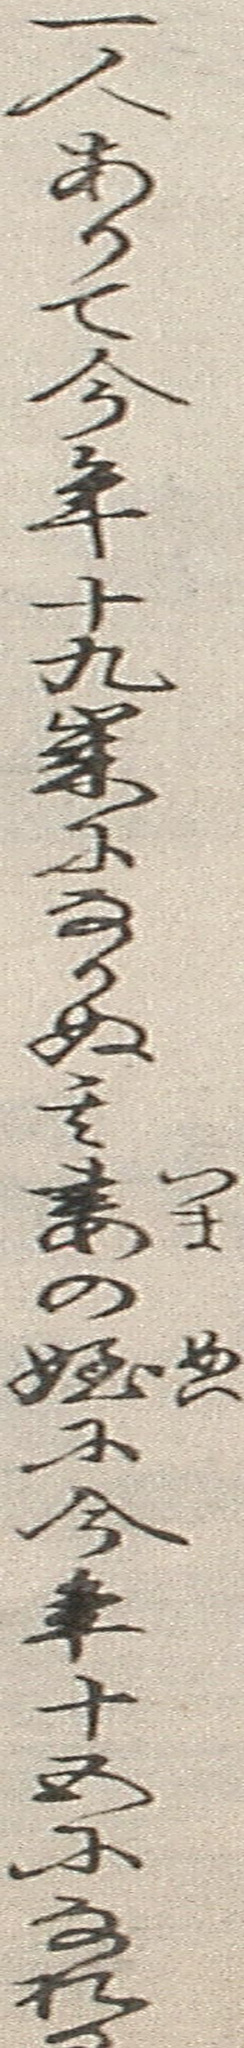一人ありて今年十九歳になりぬ其妻の姪に今年十五になれる
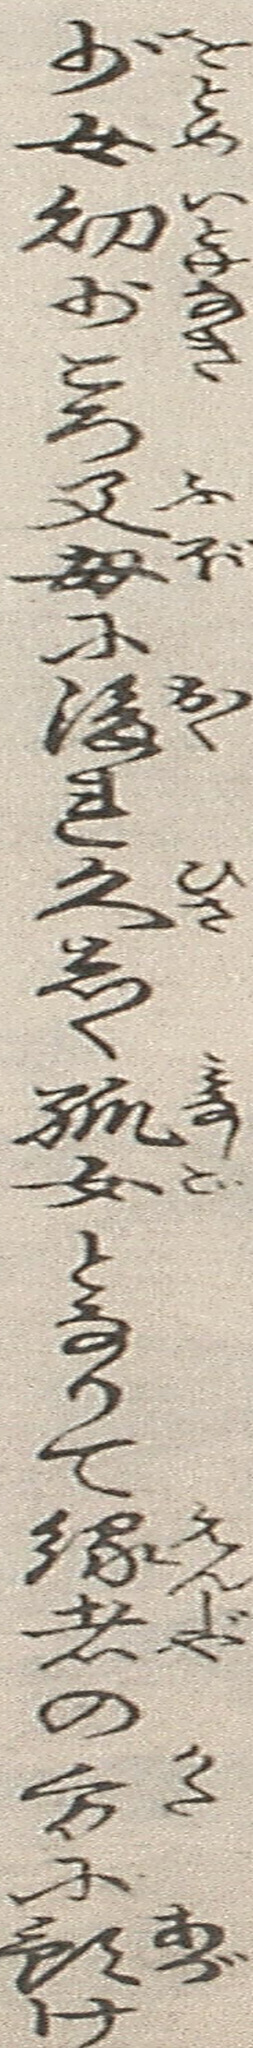少女幼少ころ父母に後れ久しく孤女となりて縁者の方に預け
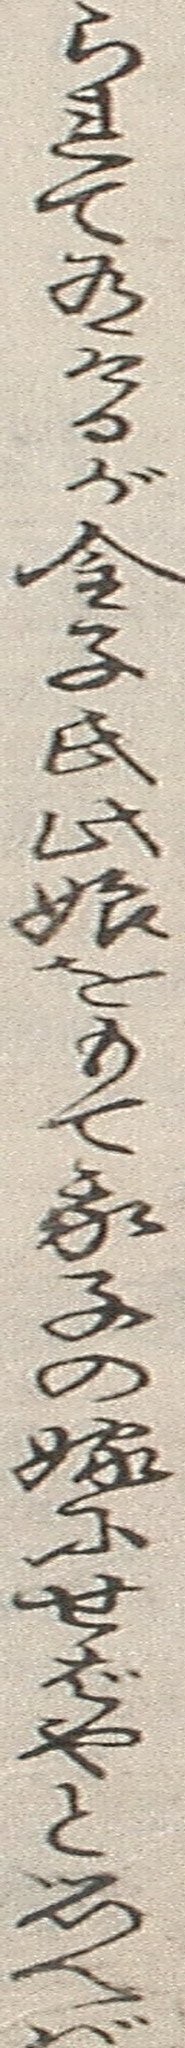られて有けるが金子氏此娘をもて我子の嫁にせばやと思へバ
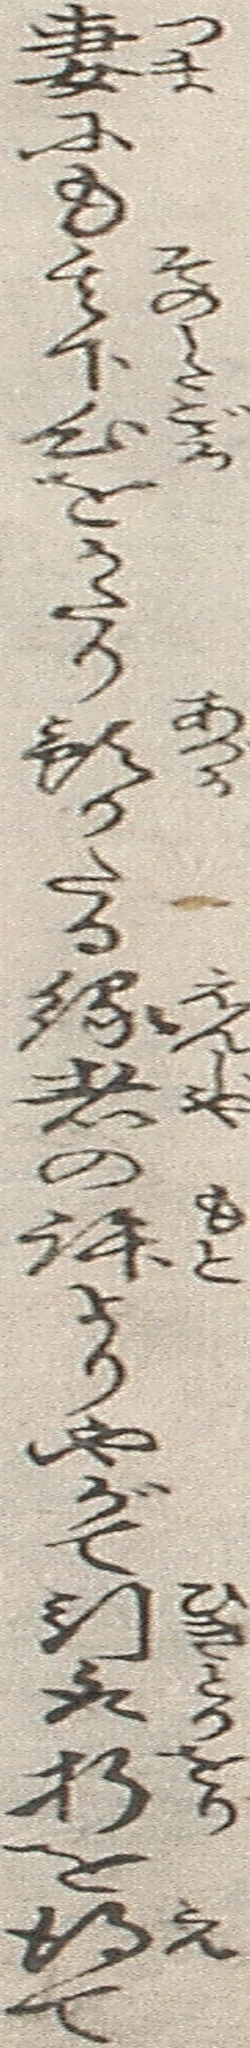妻にも其下心をかたり預りたる縁者の許よりやがて引取折を得て
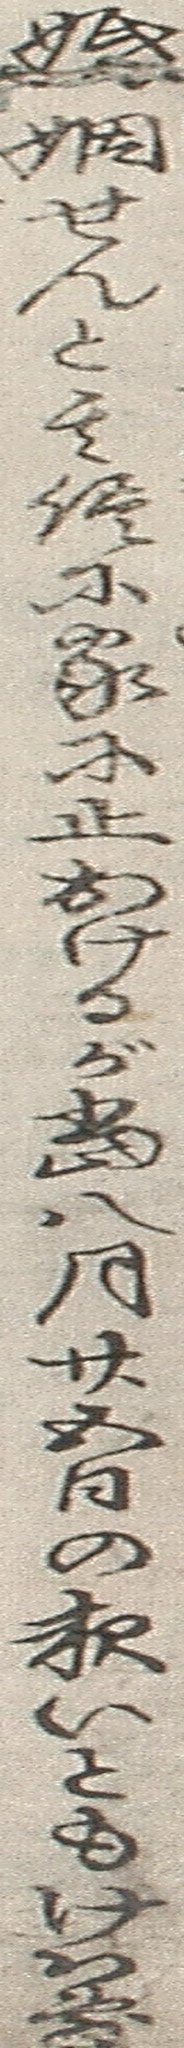婚姻せんと其侭に家に止おけるが当八月廿五日夜いともけわ敷
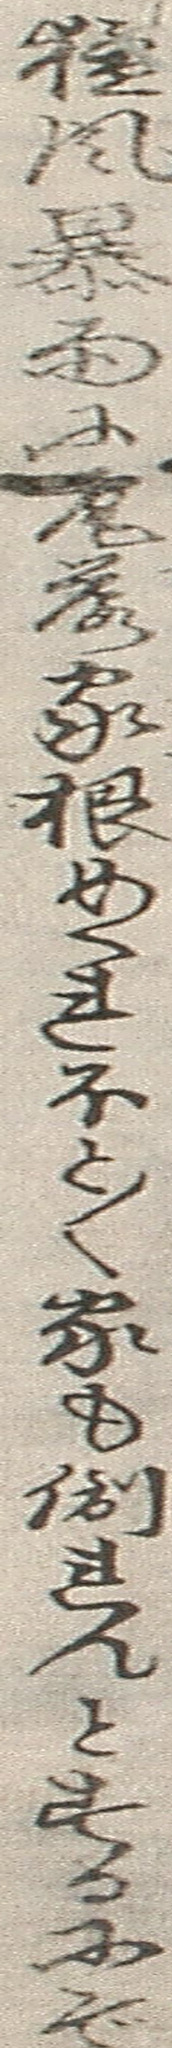猛風暴雨に瓦落家根めくれほと〳〵家も倒れんとするにぞ
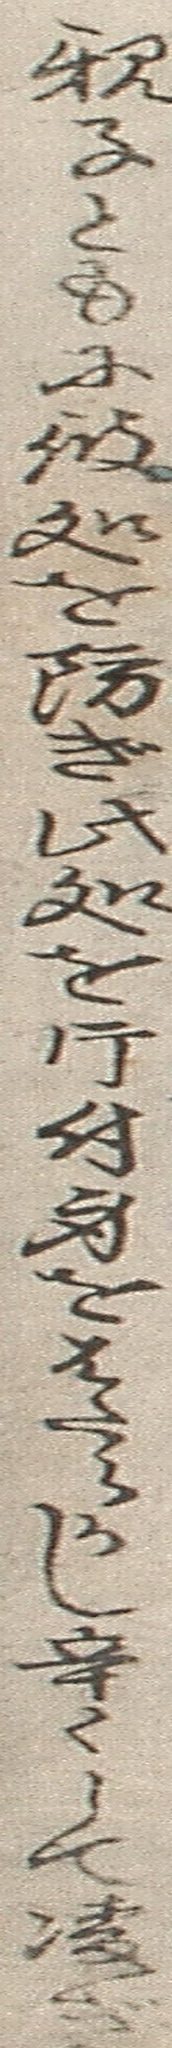親子ともに彼処を防ぎ此処を片付身をはたらかし辛くして凌ぎ

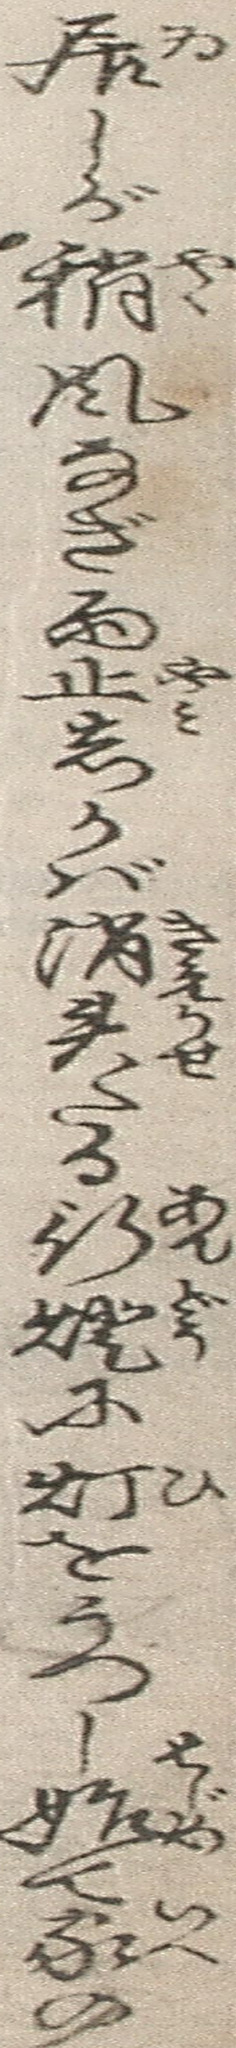居しが稍風なぎ雨止しかバ消失たる行燈に灯をうつし始て家の
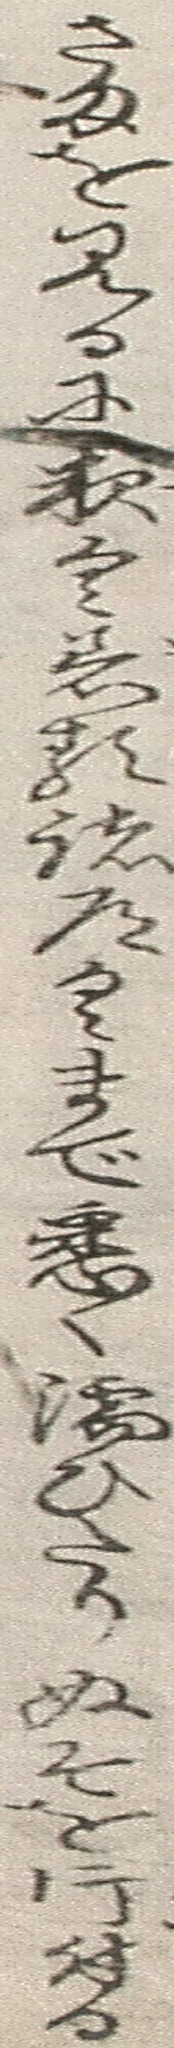さまを見るに夜具着類諸道具まで悉く濡ひたりぬそを片付る
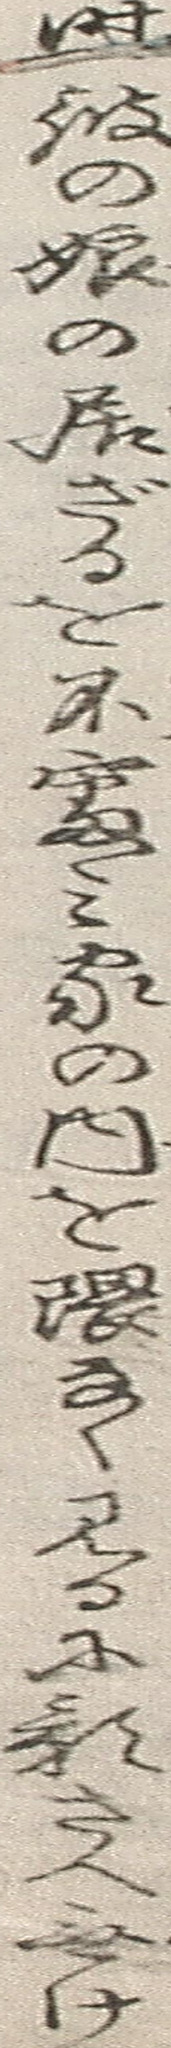時彼の娘の居ざるを不審ミ家の内を隈なく見るに影さへ無け
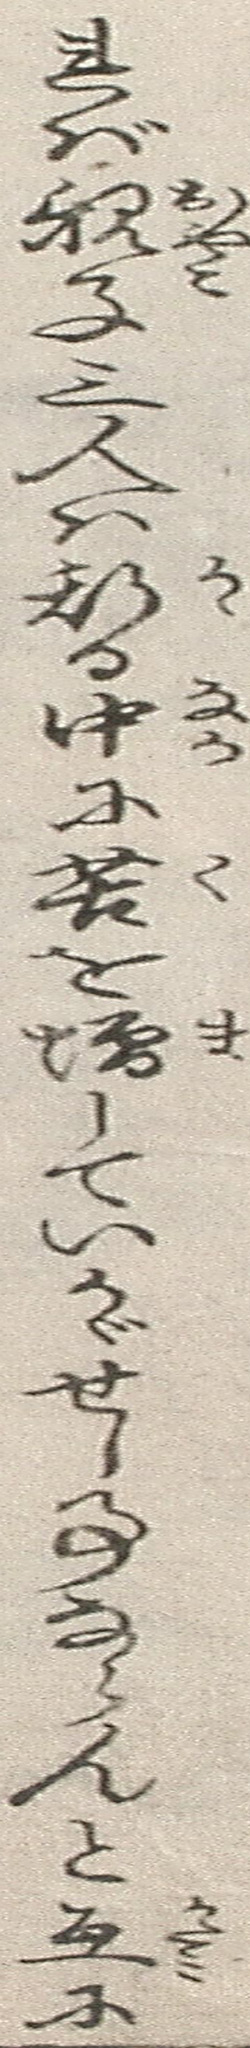れバ親子三人ハ斯る中に苦を増していかゞせし事ならんと互に
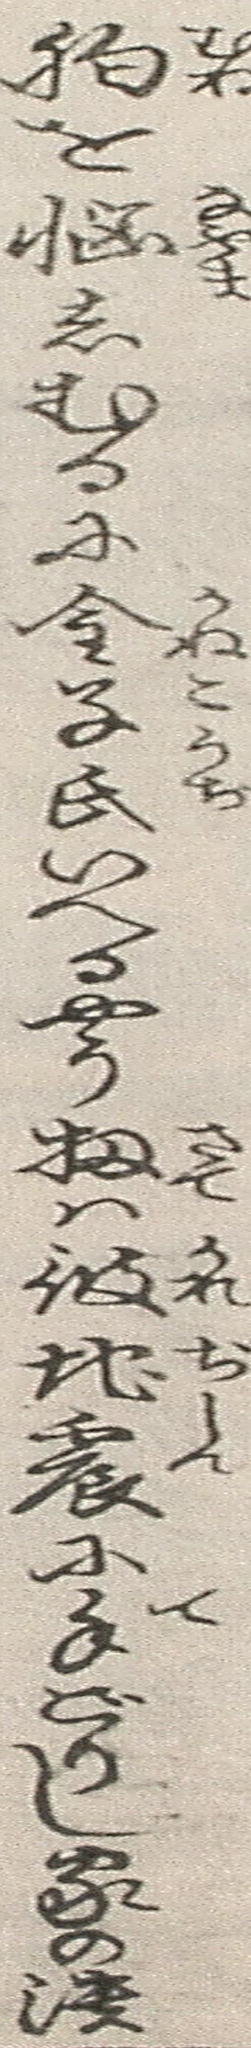胸を悩しむるに金子氏いへるやう扨ハ彼地震に手ごりし家の潰
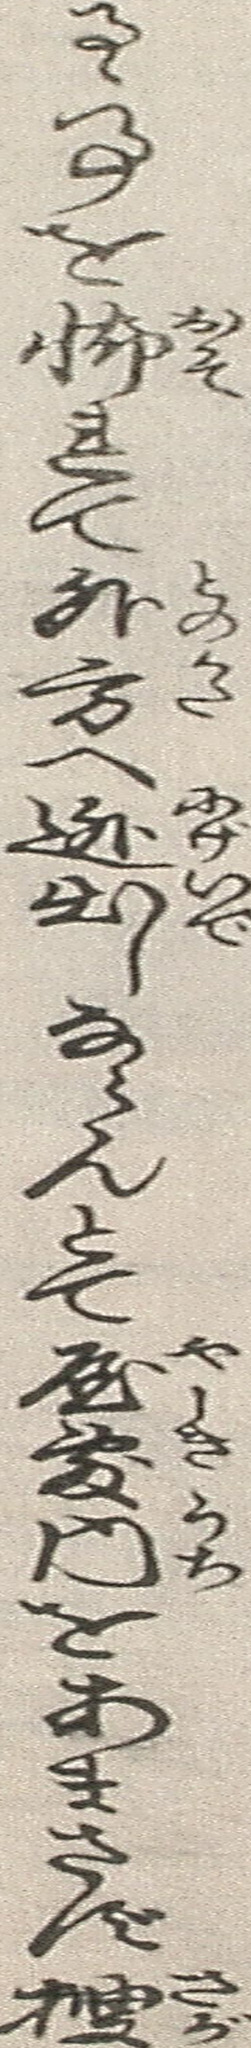るゝ事を怖れて外方へ逃出ならんとて屋敷内をあまさず捜
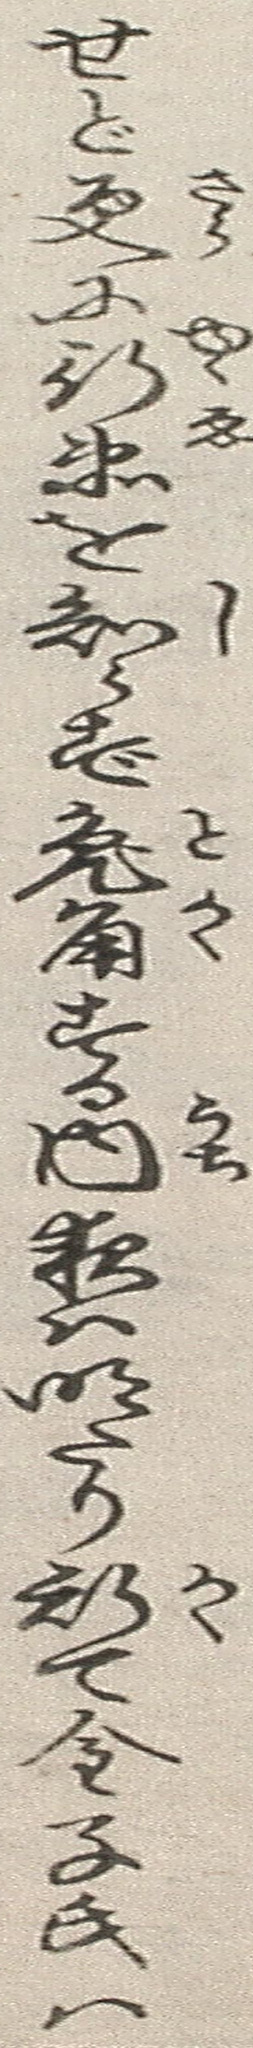せど更に行衛を知らず兎角する内夜ハ明たり斯て金子氏ハ
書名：安政風聞集　上中下　全
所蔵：東京大学地震研究所図書室 Earthquake Research Institute Library, The University of Tokyo, JAPAN
